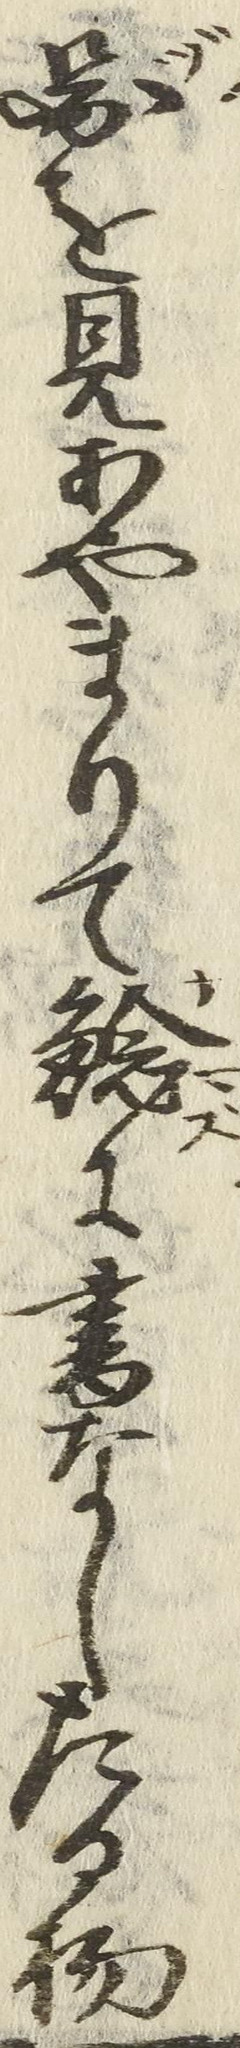図を見あやまりて鯰に書なしたる物
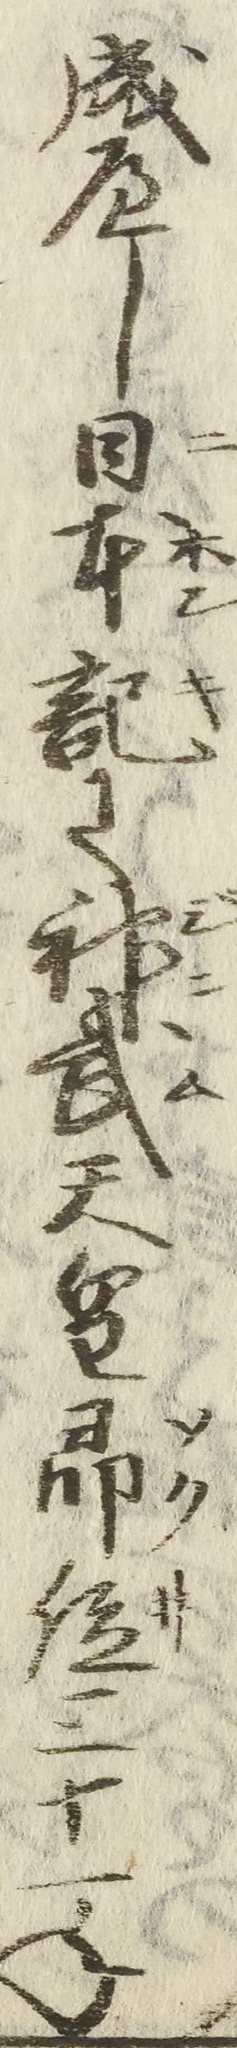成へし日本記に神武天皇即位三十一年
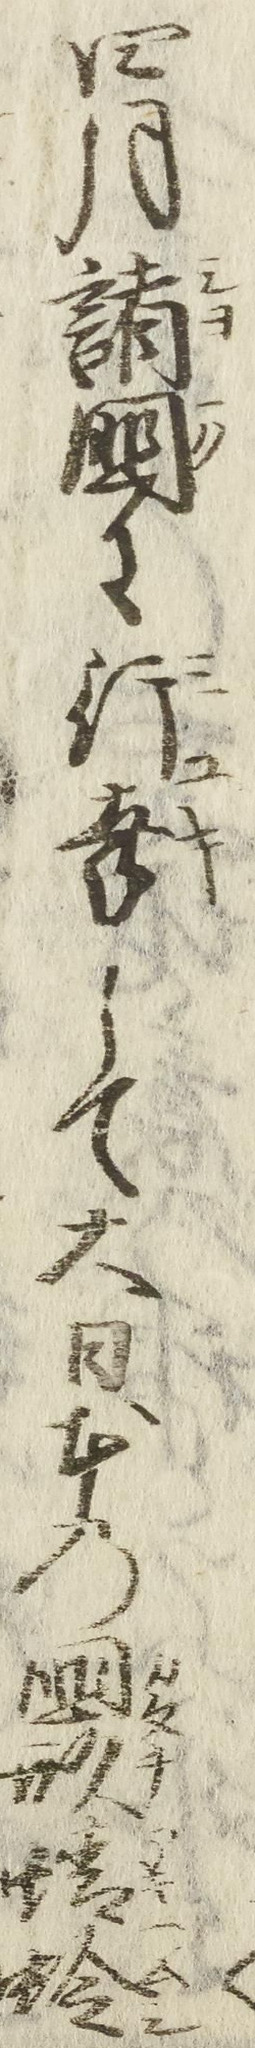四月諸国に行幸して大日本の国形蜻蛉
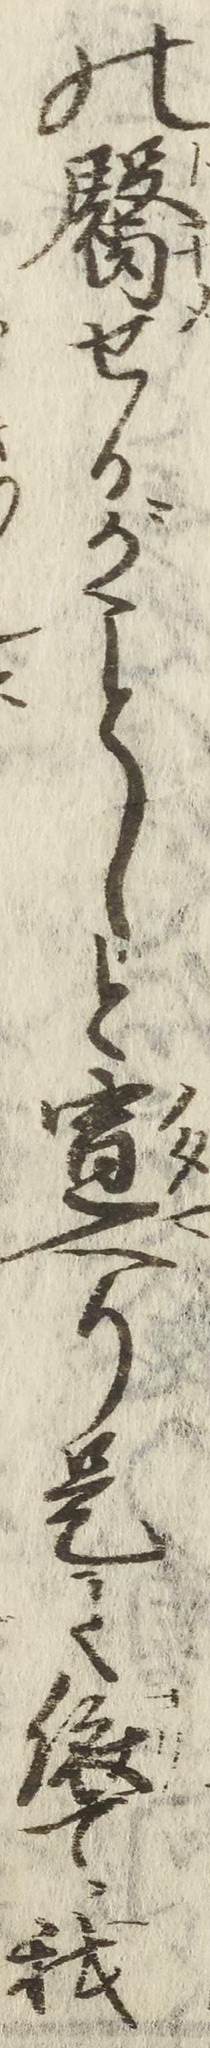の臀呫せるがことしと宣へり是に依て我
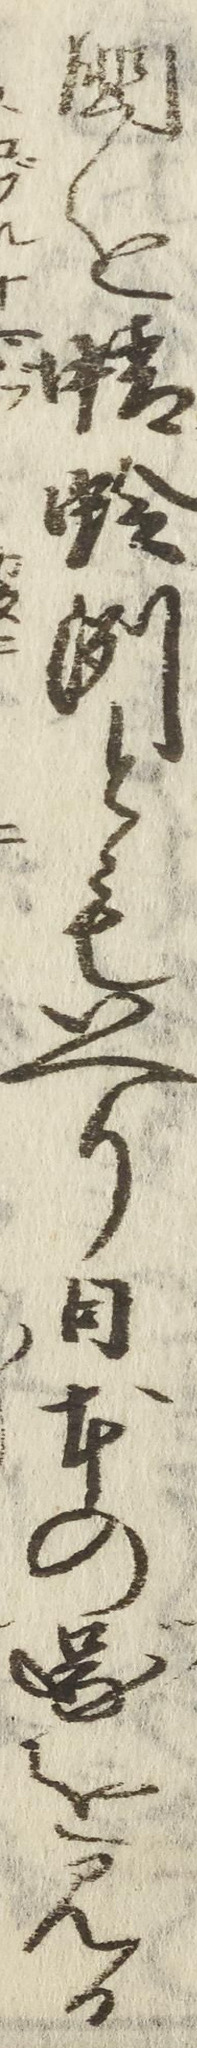国を蜻蛉洲ともいへり日本の図を見る
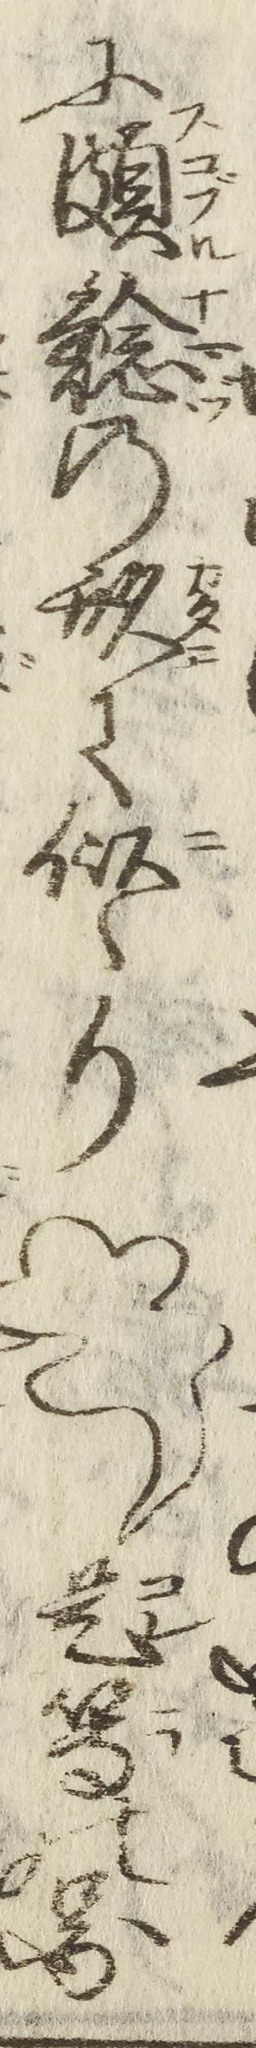に頗鯰の形に似たり是等の図
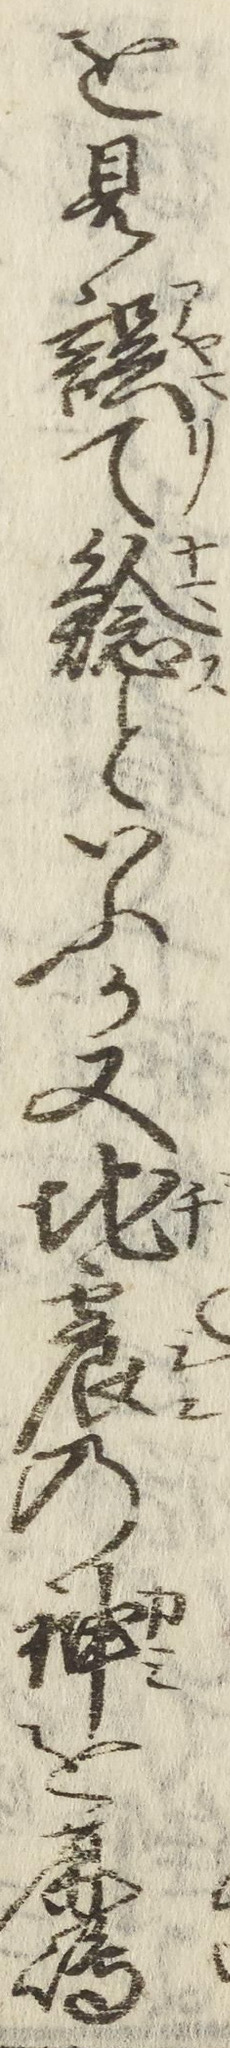を見誤て鯰といふか又地震の神を鹿嶋
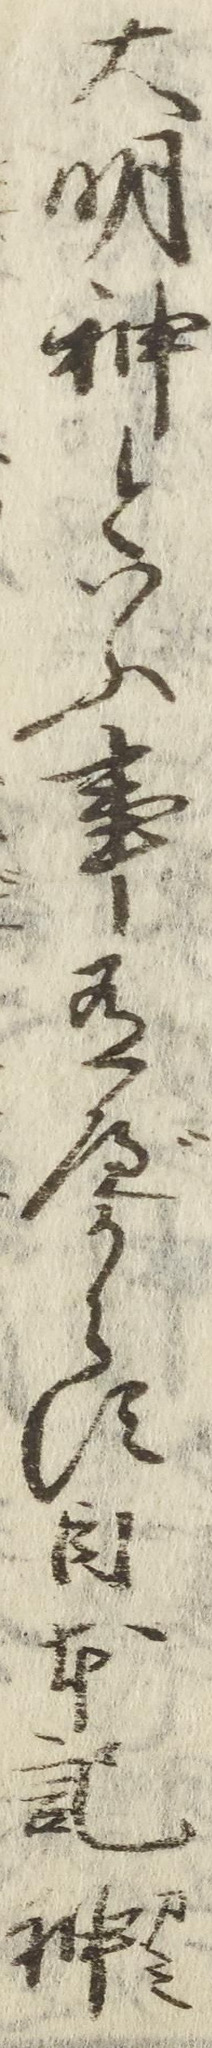大明神といふ事有べからす日本記神
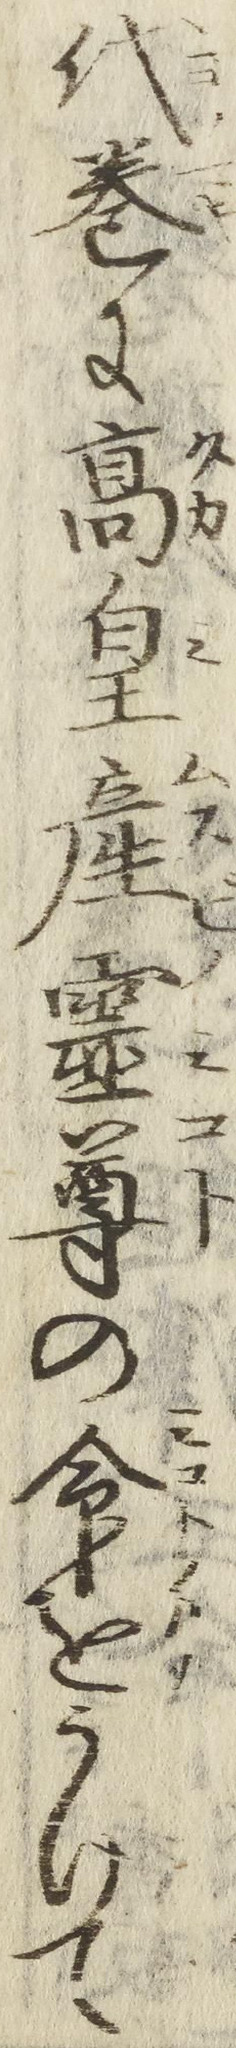代巻の高皇産霊尊の命をうけて

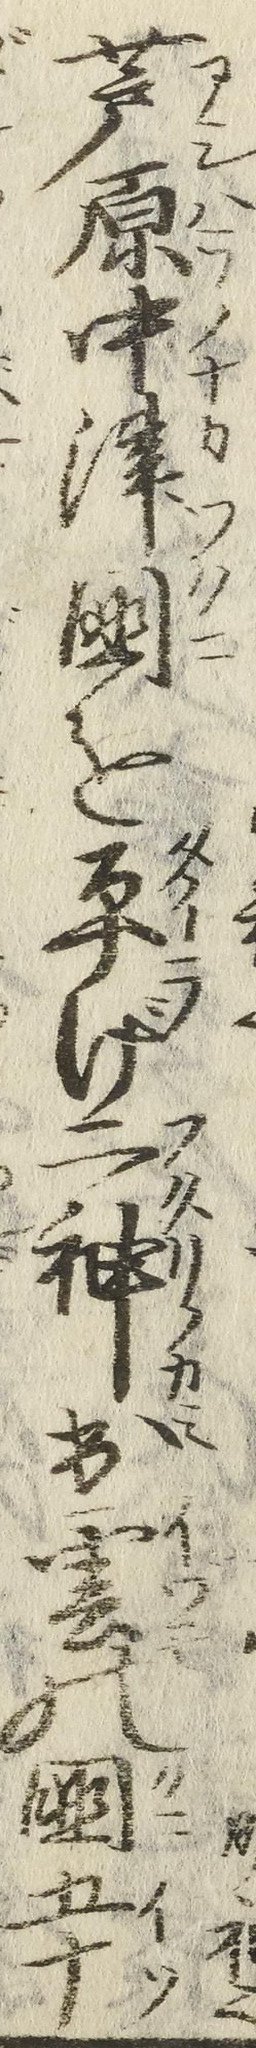芦原中津国を平げ二神出雲の国五十
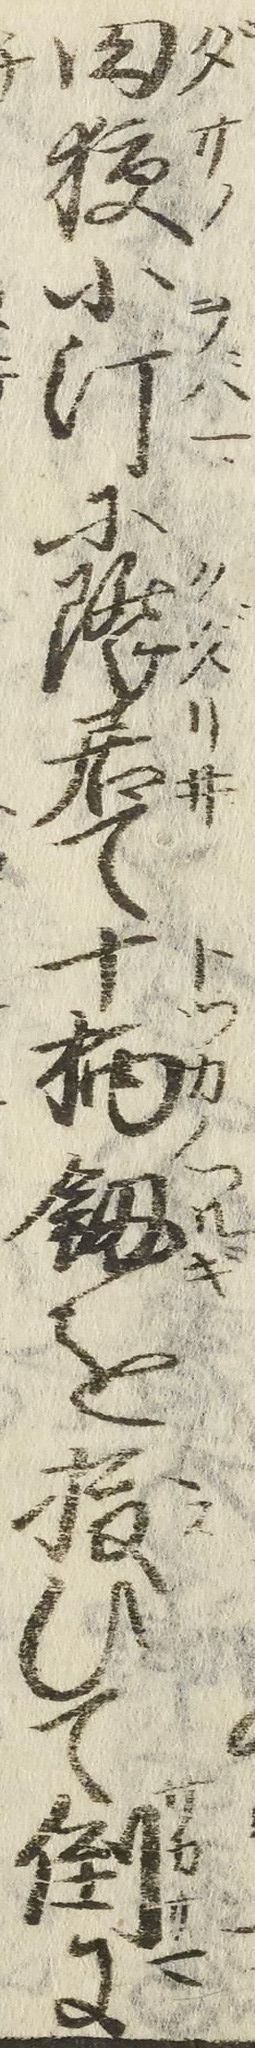田狭小汀に降居て十柄劔を抜ひて倒に
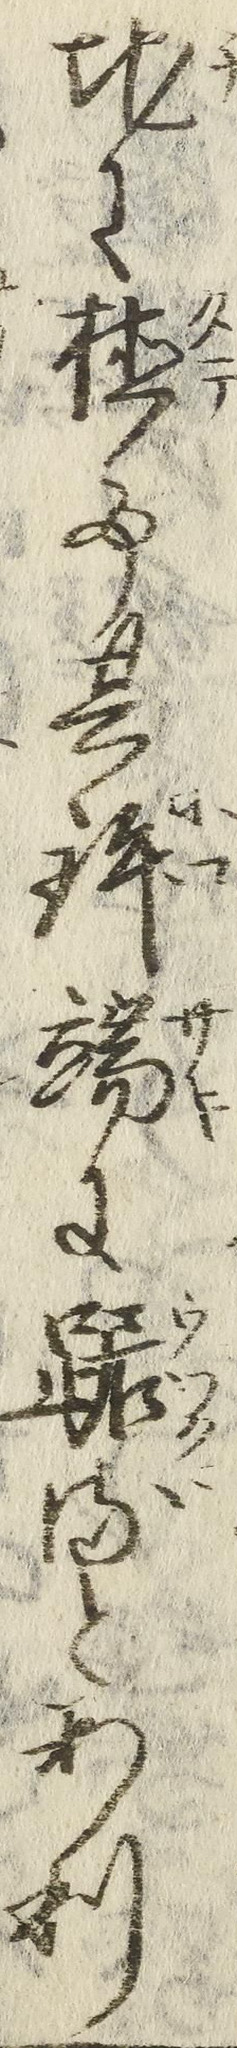地に植る其鉾端に踞るとあり
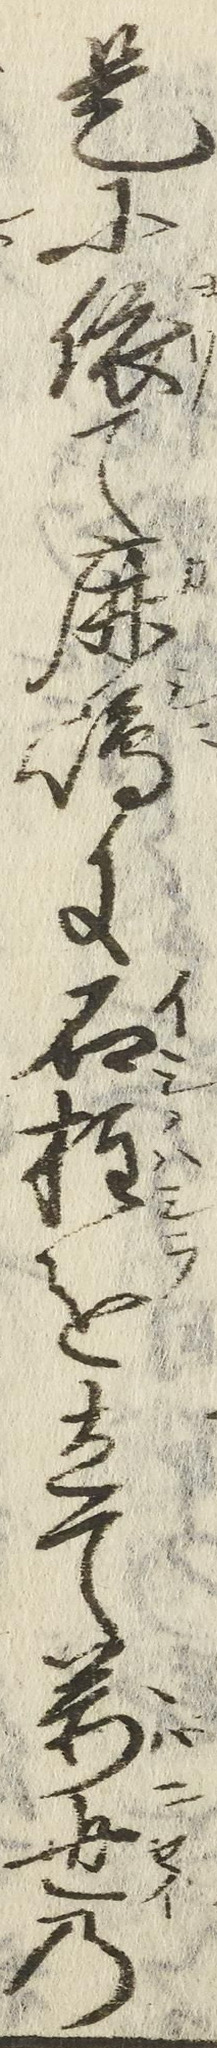是に依て鹿嶋に石柱を立て万世の
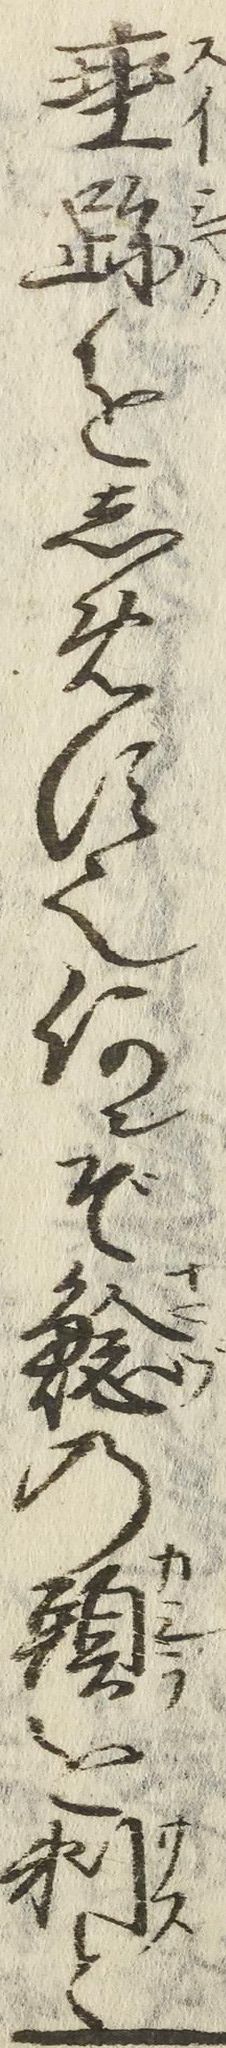垂跡をしめす也何ンぞ鯰の頭を刺と
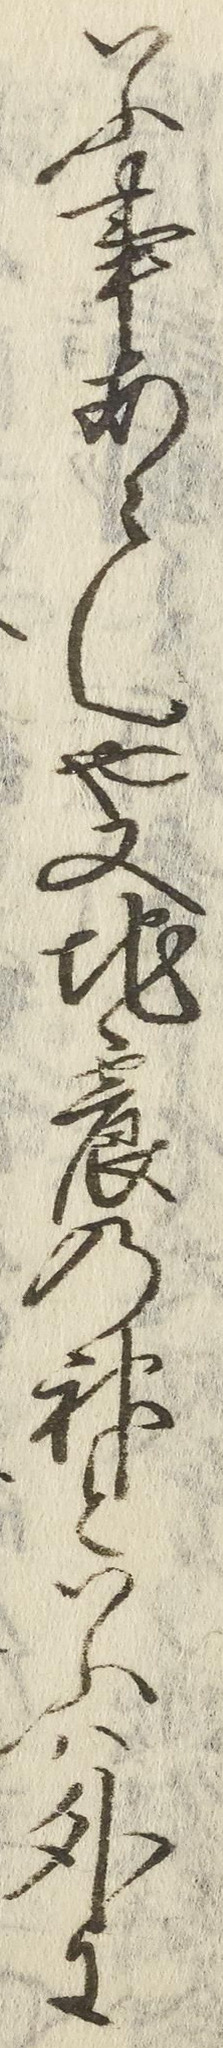いふ事あらんや又地震の神といふは外に
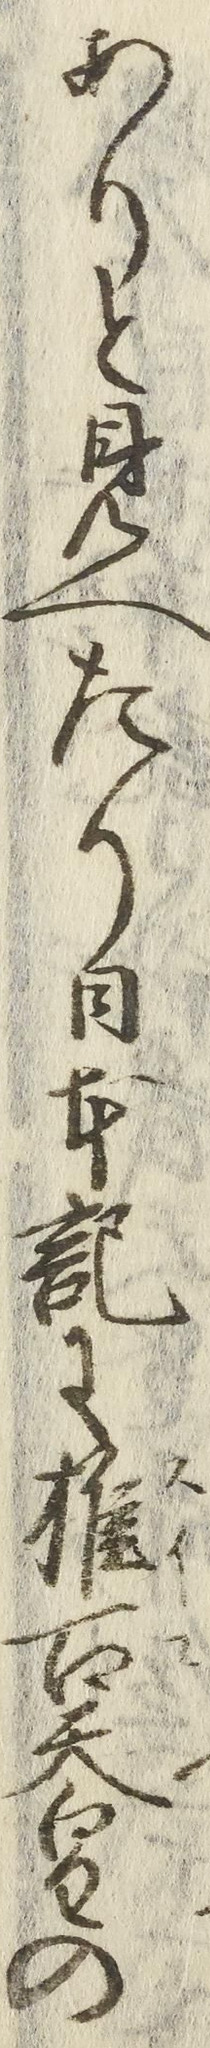ありと見へたり日本記に推古天皇の
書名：天地或問珍　天
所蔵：東京大学地震研究所図書室 Earthquake Research Institute Library, The University of Tokyo, JAPAN
